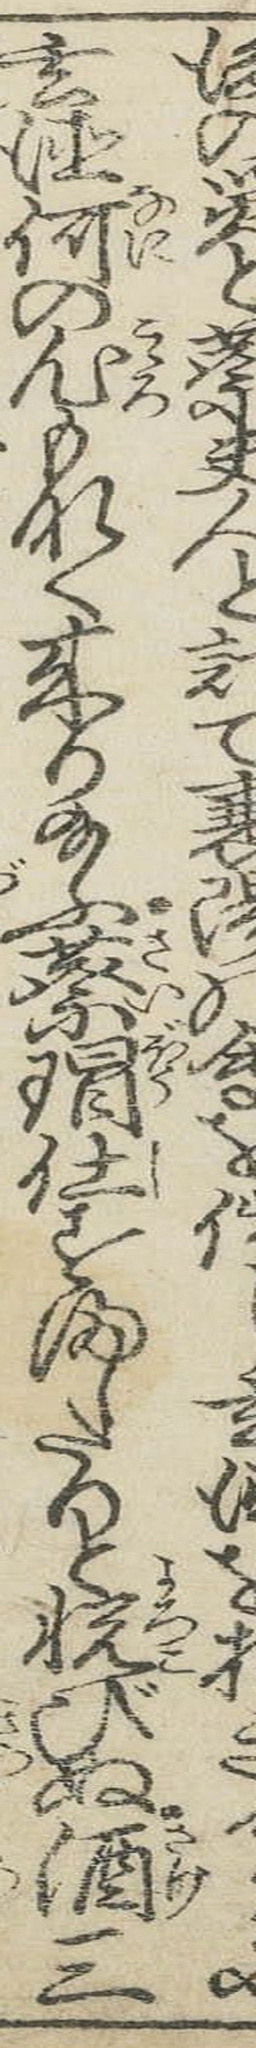玄徳何の心もなく来り給ふ。蔡瑁仕すましたりと悦びぬ。酒三
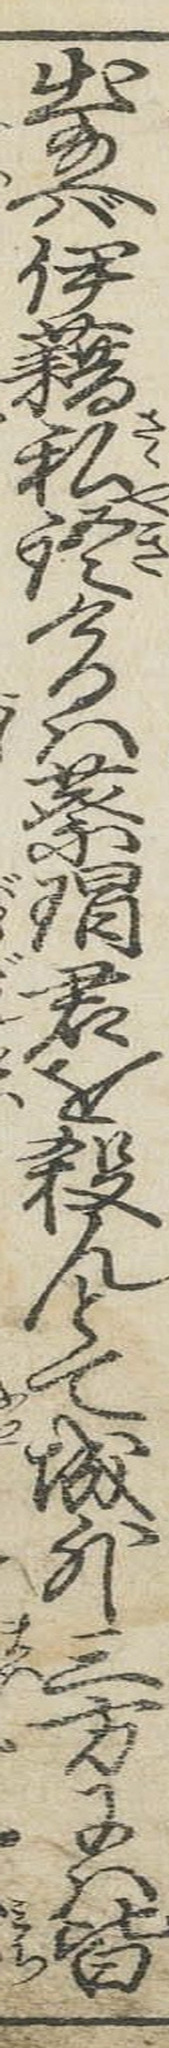出給へば伊藉私語けるは蔡瑁君を殺んとて城外三方には皆
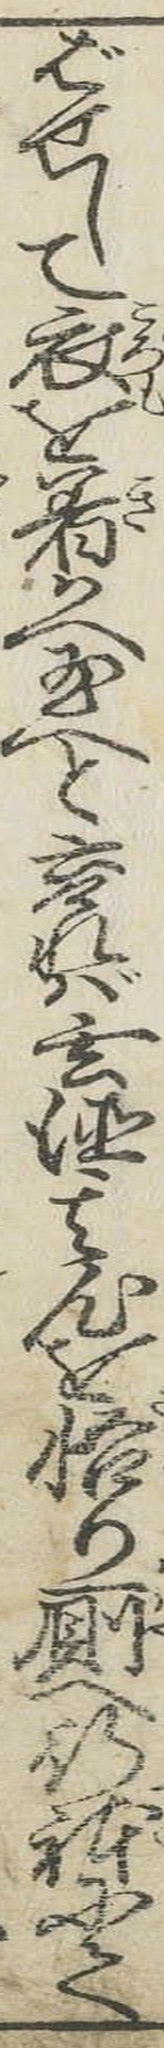ばせして衣を着かへ玉へと云ければ玄徳其心を悟り厠へ行体にて
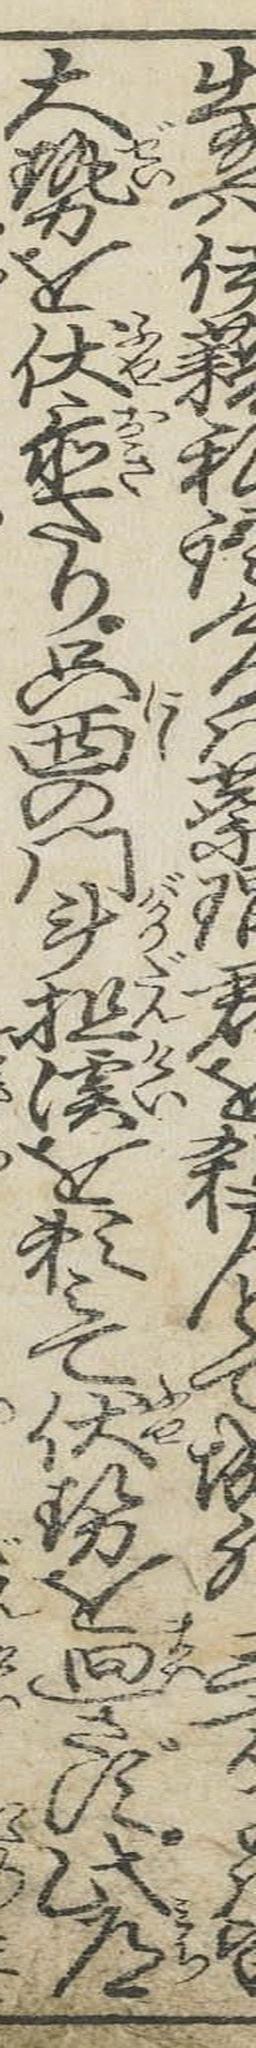大勢を伏置たり。只西の門計担溪を頼みて伏勢を廻さず。此道
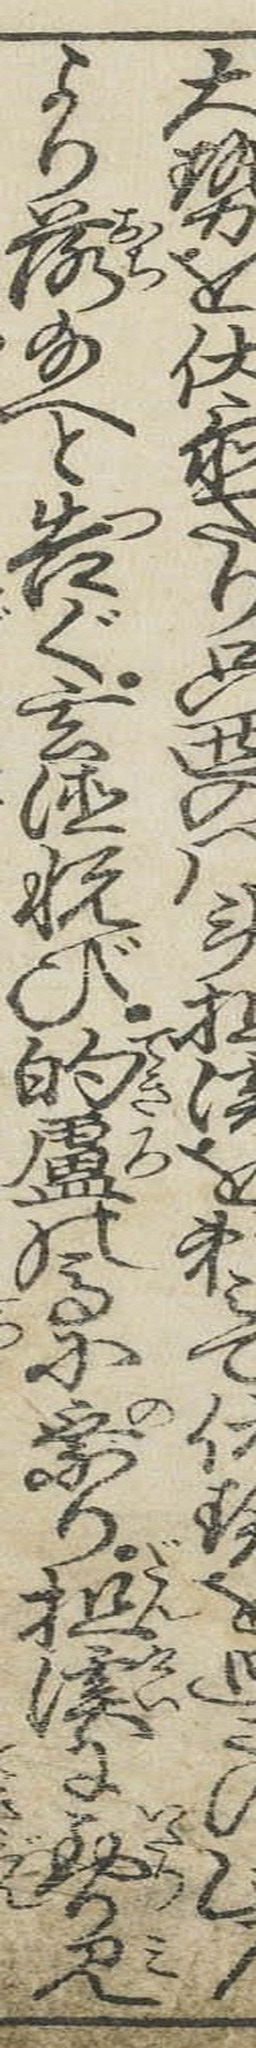より落給へと告ぐ。玄徳悦び。的盧の馬に乗り。担溪に到り見
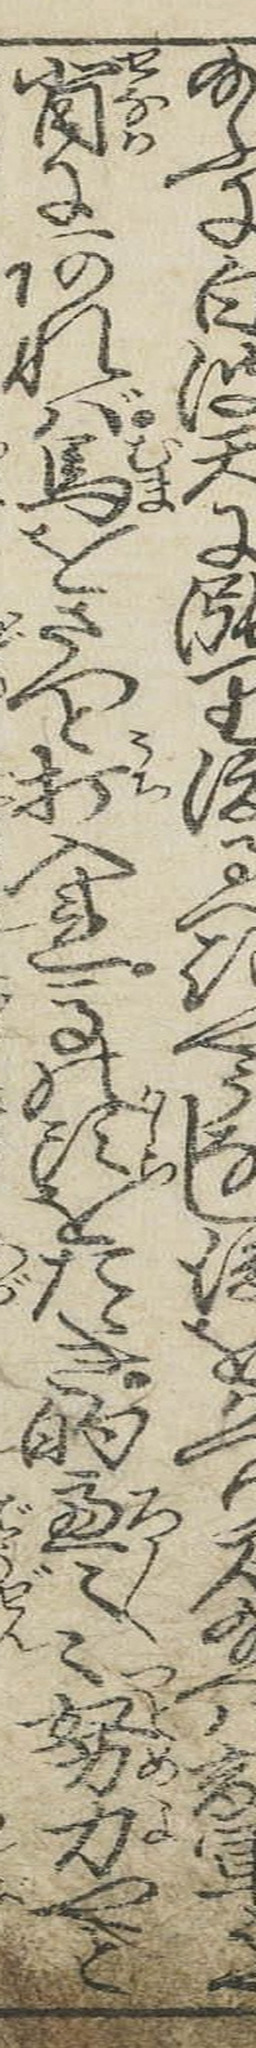背にあれば。馬をさつと打入れ。馬の頭をたゝき。的盧々々努力やと
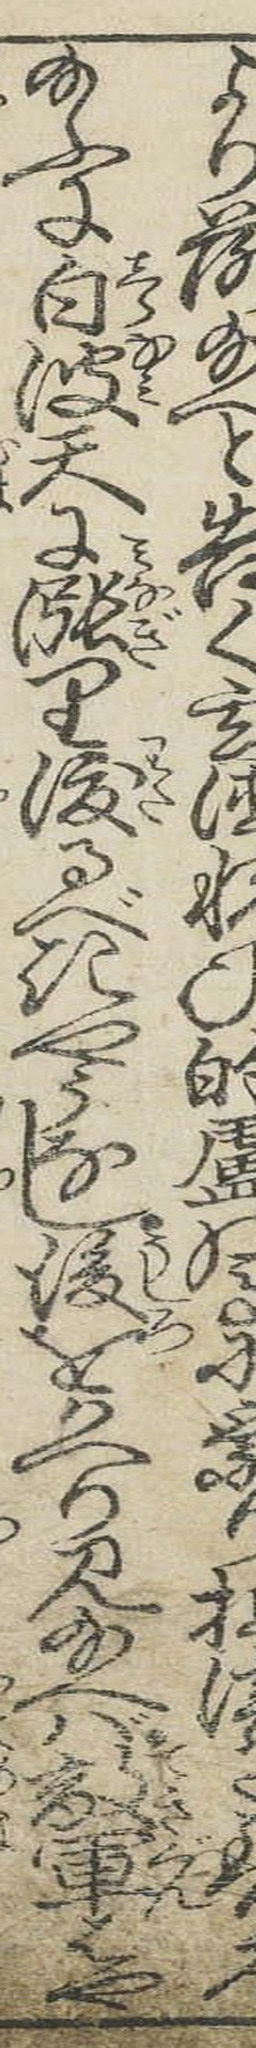給ふに白波天に漲り渡るべきやうなし。後をかへり見給へば。敵軍はや
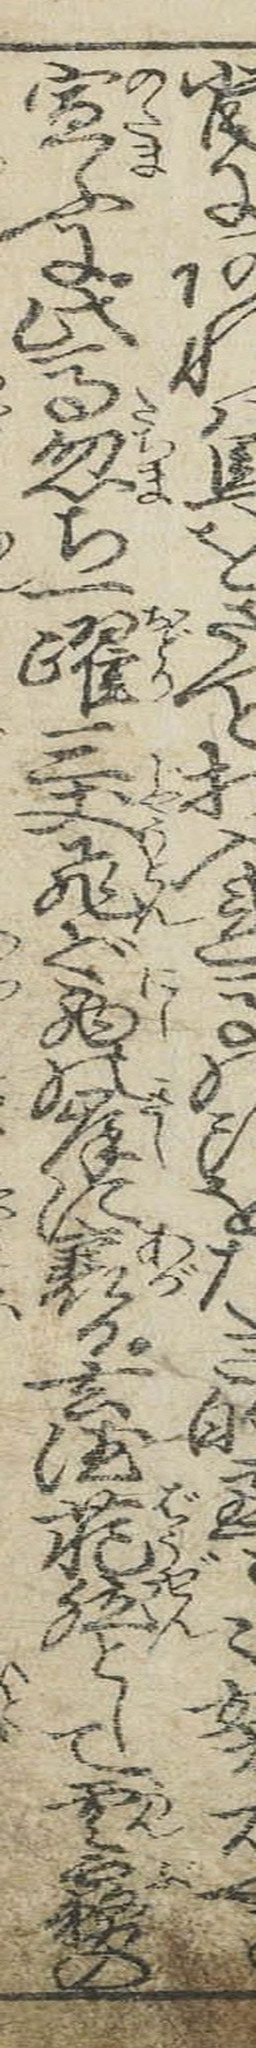宣ふに。此馬忽ち一躍三丈飛で西の岸に襄る。玄徳茫然として雲霧の
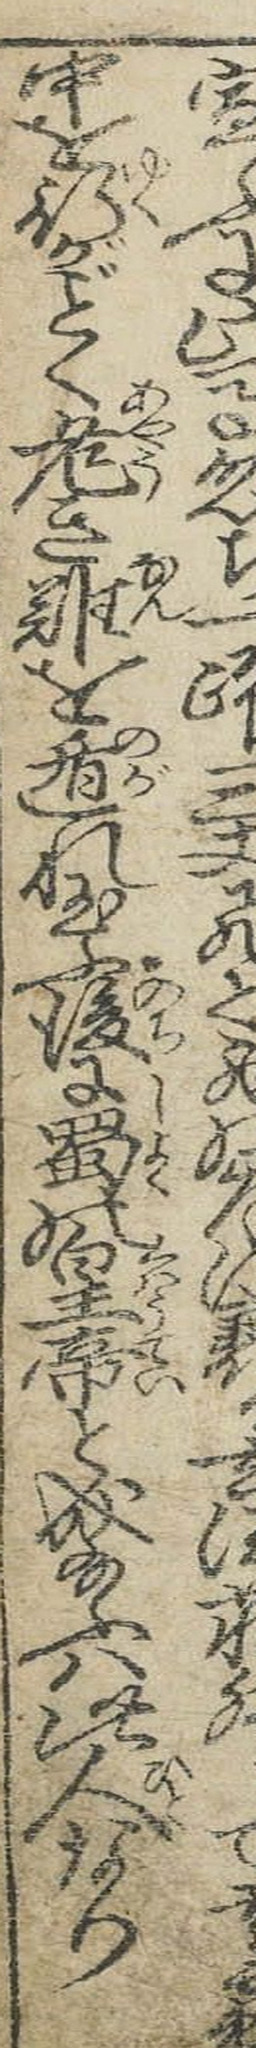中を行がごとく危き難を遁れ玉ふ。後に蜀の皇帝と成給ふは此人なり

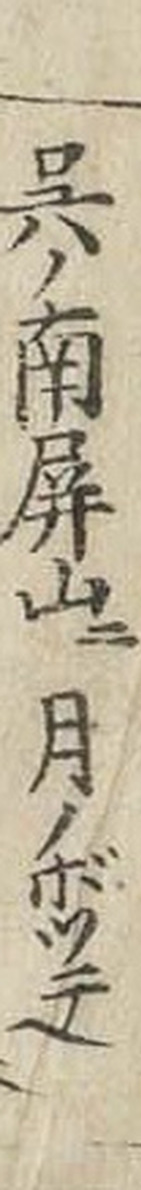呉ノ南屏山月ノボツテ
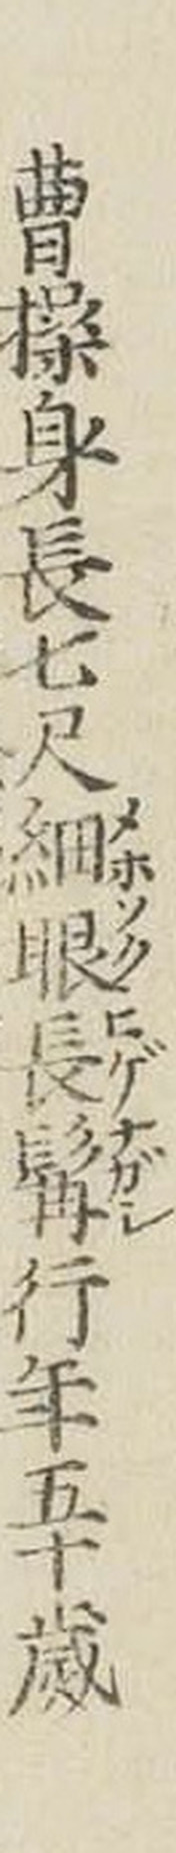曹操身長七尺細眼長髯行年五十歳
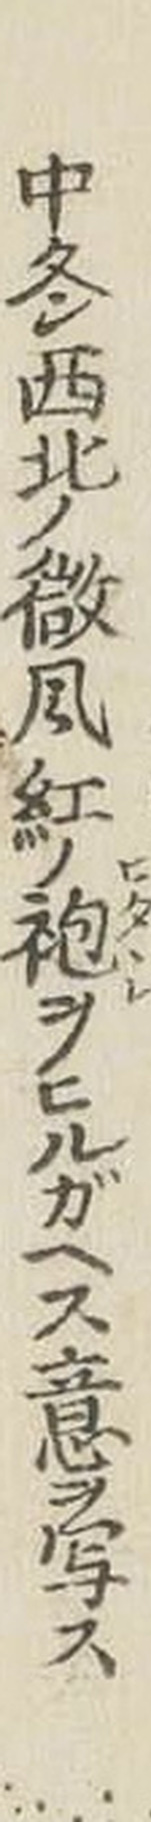中冬西北ノ微風紅ノ袍ヲヒルガヘス意ヲ写ス薄墨

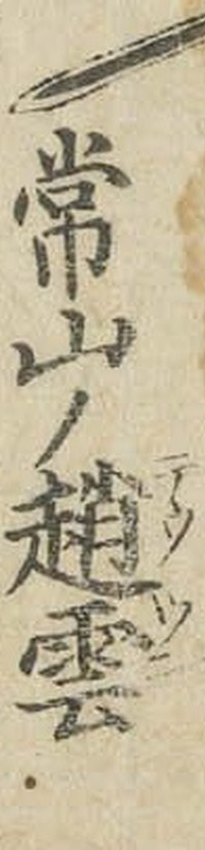常山ノ趙雲
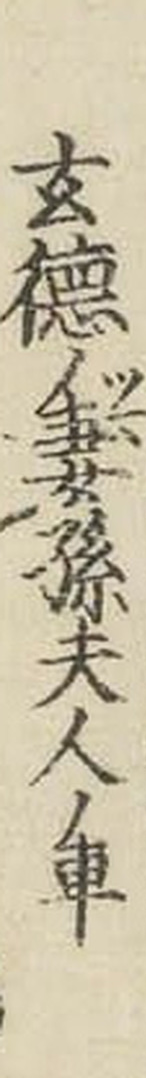玄徳ノ妻孫夫人ノ車
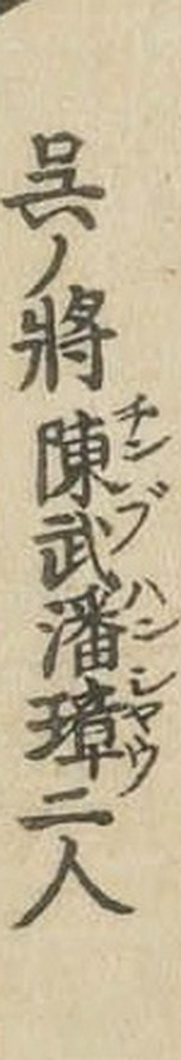呉ノ将陳武潘璋二人

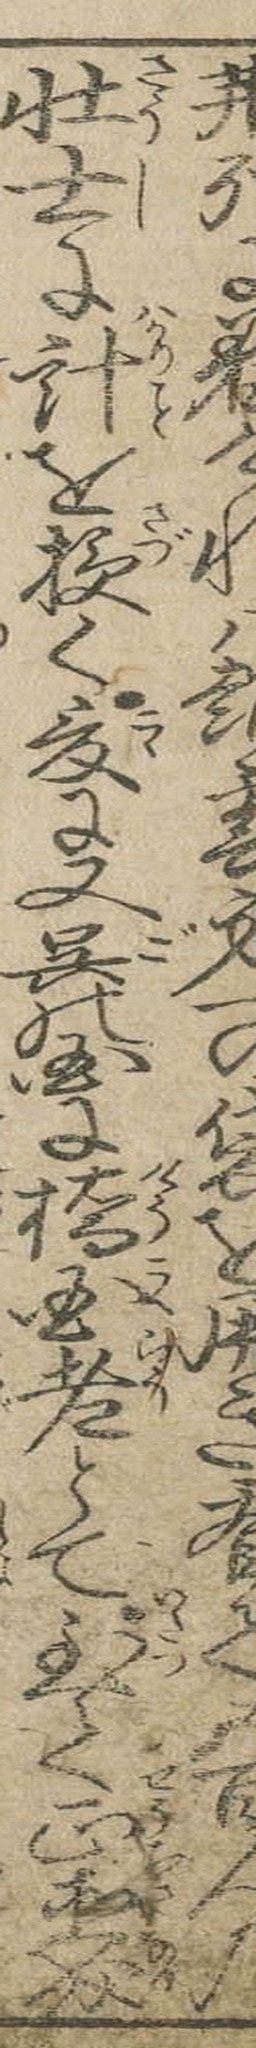壮士に計を授く。爰に又呉の国に橋国老とて。至て正直成
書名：絵本写宝袋 9巻 7之巻
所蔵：東京学芸大学教育コンテンツアーカイブ
